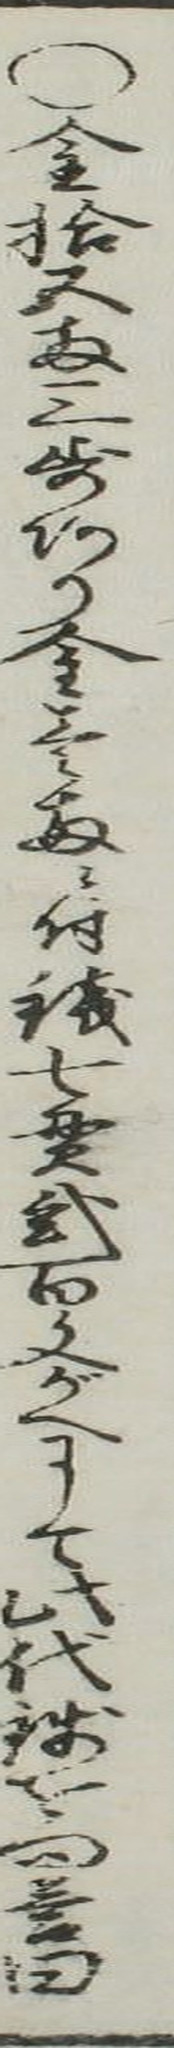○金拾五両三歩あり金一両に付銭七貫二百文がへにして此代銭を問答曰
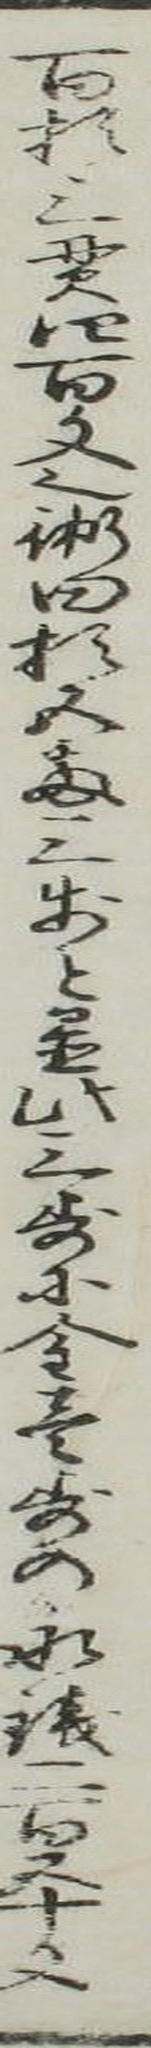百拾三貫四百文也術曰拾五両三歩と置此三歩に金壱歩の永銭二百五十文
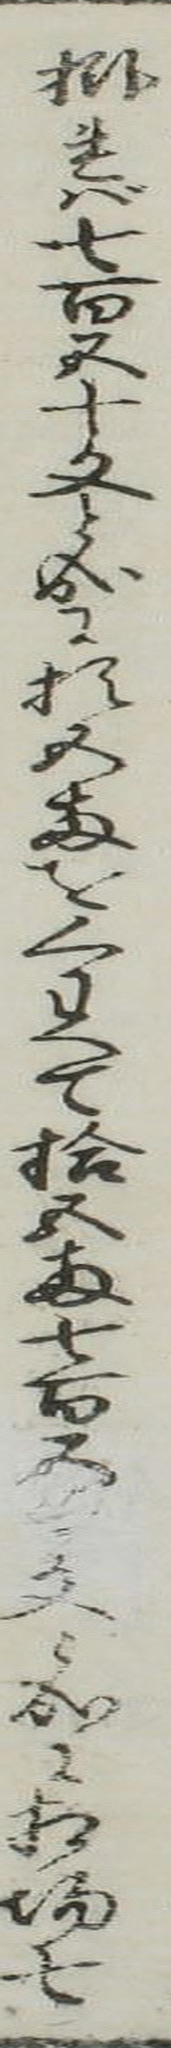掛れば七百五十文と成に拾五両をくわへて拾五両七百五十文と成に相場七
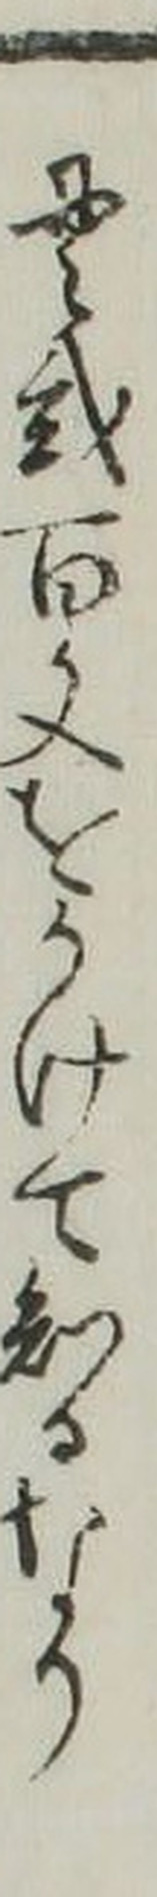貫二百文をかけて知るなり
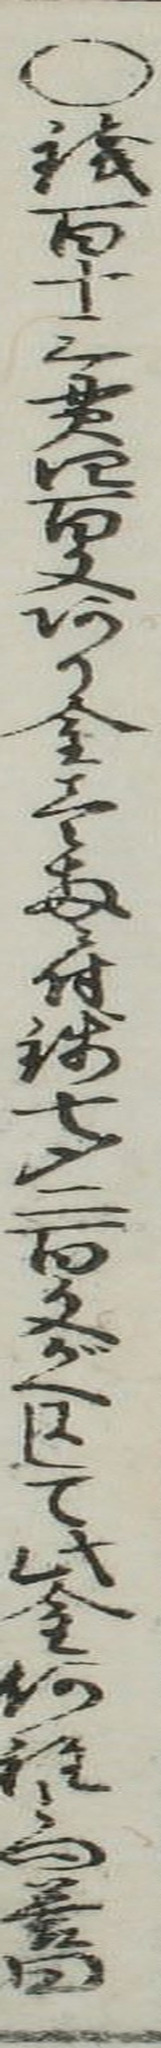○銭百十三貫四百文あり金壱両に付銭七貫二百文がへにして此金何程と問答曰
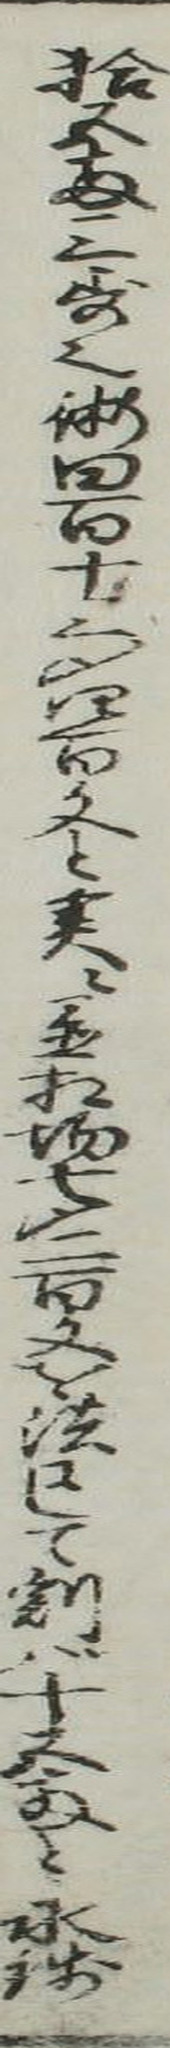拾五両三歩也術曰百十三貫四百文と実に置相場七貫二百文を法にして割ば十五両と永銭
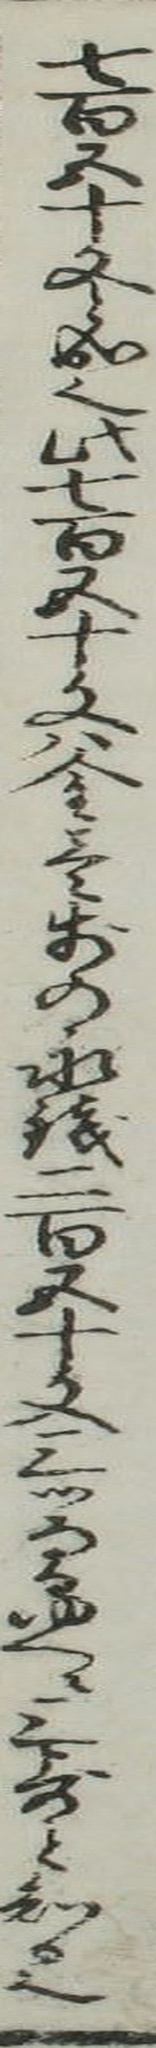七百五十文と成也此七百五十文は金壱歩の永銭二百五十文三ツなるゆへに三歩と知る也

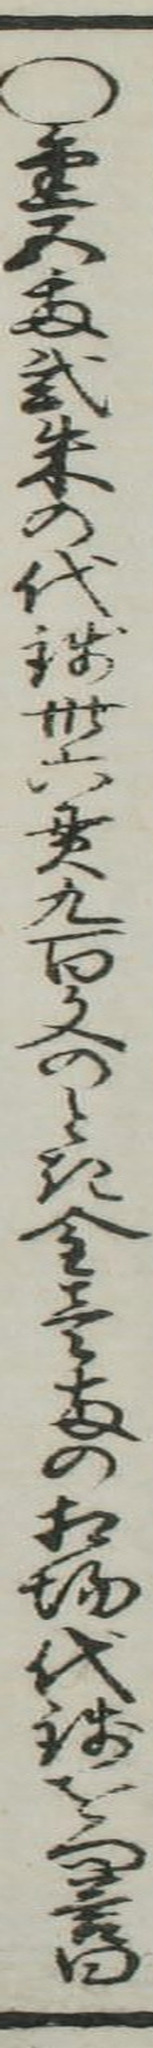○金五両弐朱の代銭卅六貫九百文のとき金壱両の相場代銭を問答曰
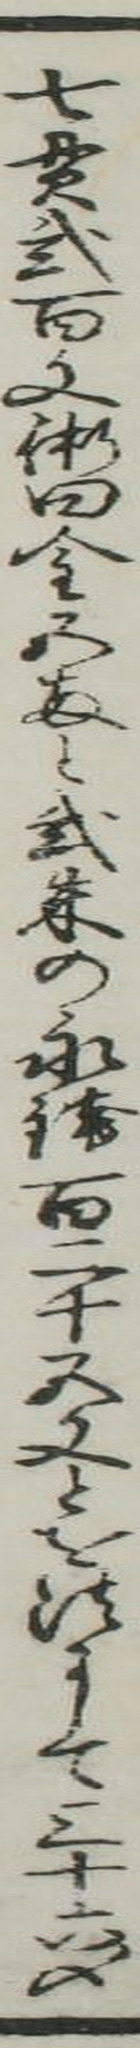七貫弐百文術曰金五両と弐朱の永銭百二十五文とを法にして三十六貫
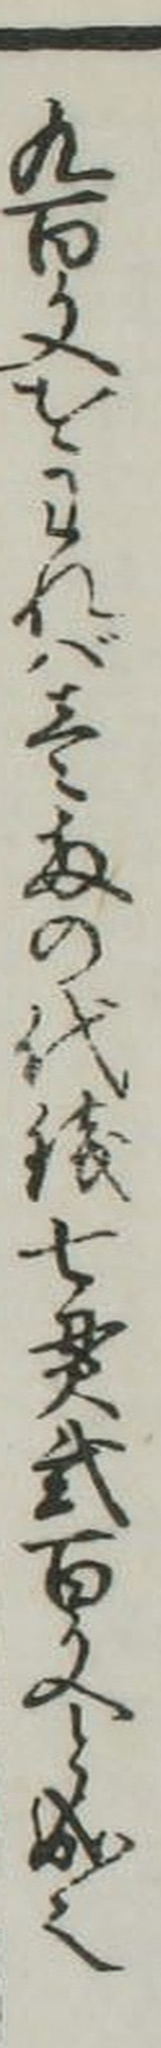九百文をわれば壱両の代銭七貫弐百文と成也
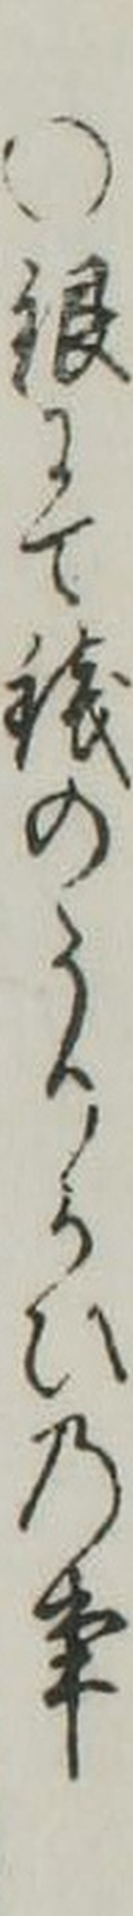○銀にて銭のうりかひの事
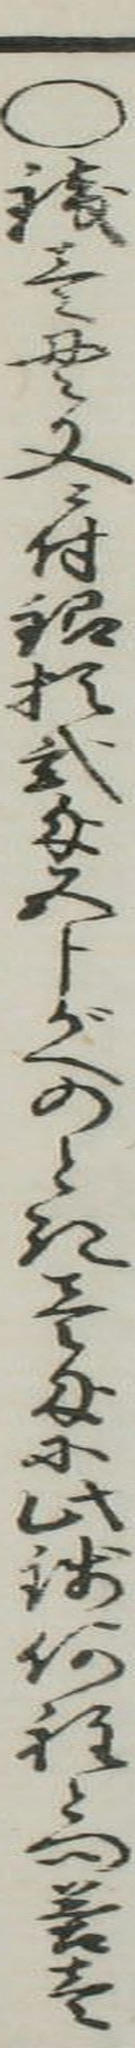○銭壱貫文に付銀拾弐匁五分がへのとき壱匁に此銭何程と問答壱
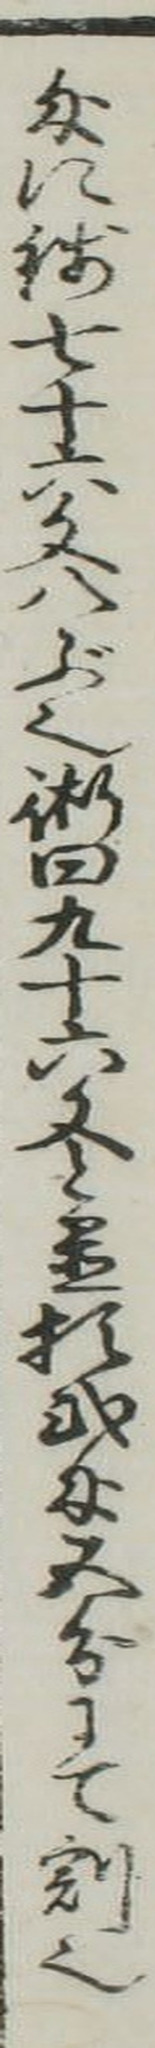匁に銭七十六文八ぶ也術曰九十六文と置拾弐匁五分にて割也
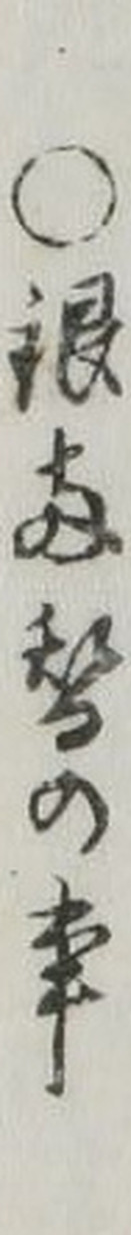○銀両替の事
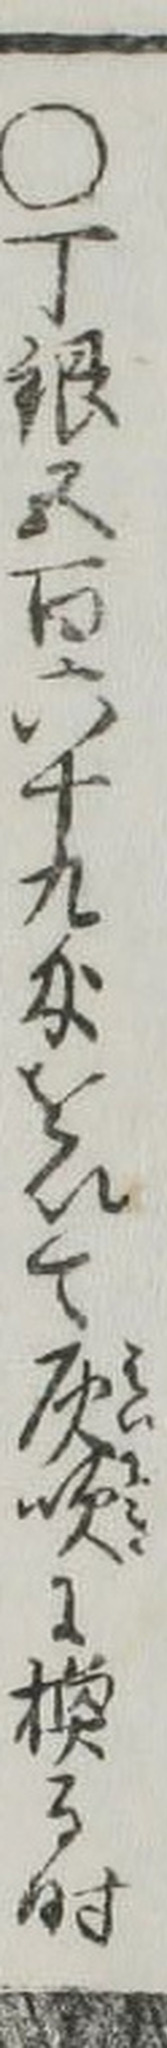○丁銀五百六十九匁を以て灰吹に換る時
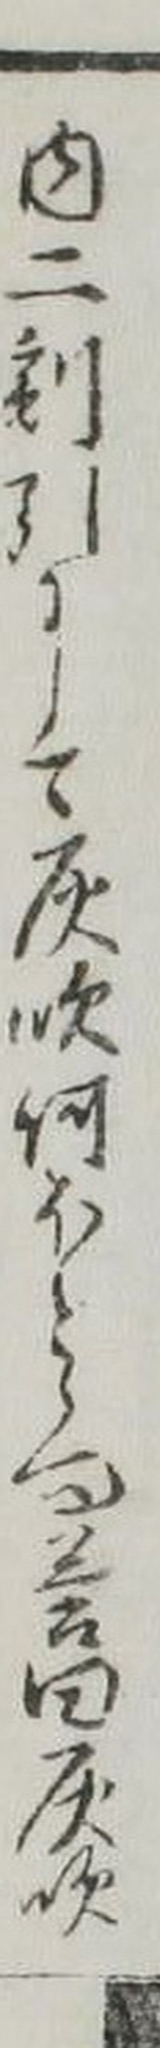内二割引にして灰吹何ほとゝ問答曰灰吹
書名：宝玉塵劫記
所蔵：東京学芸大学教育コンテンツアーカイブ
